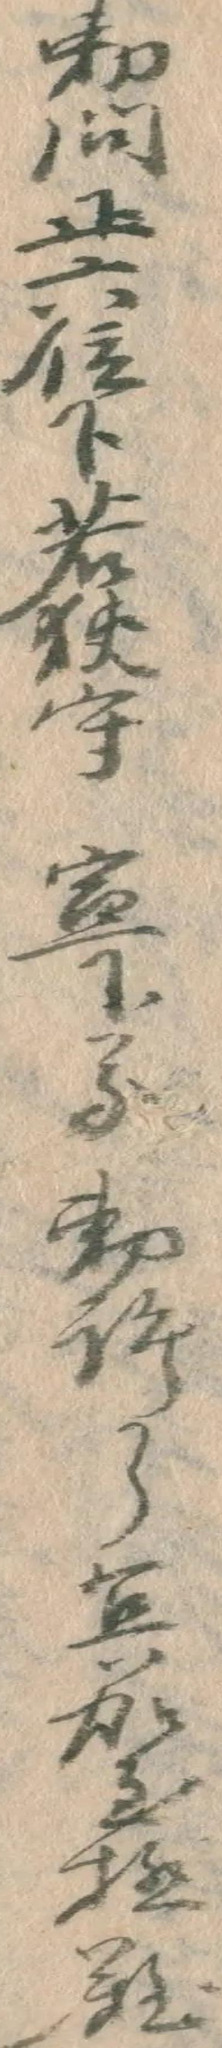勅問正六位下若狭守宣下蒙勅許了冥加至極難
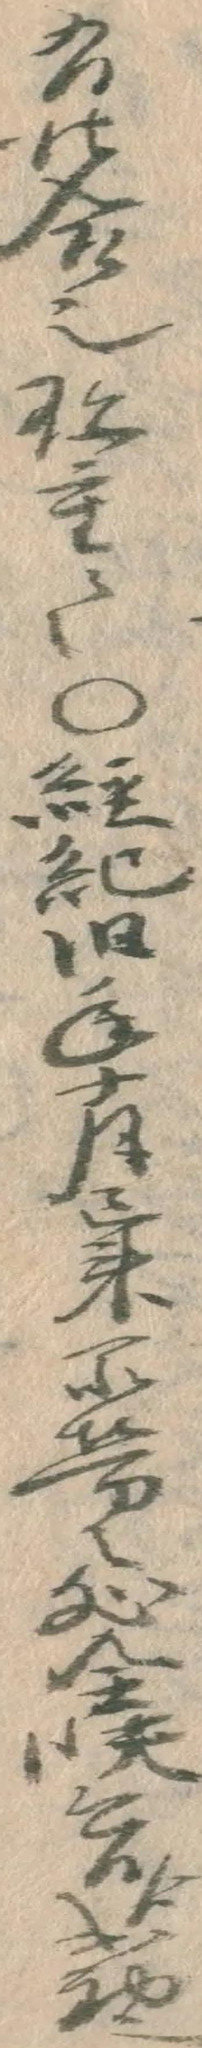有仕合也珍重々々○経紀旧年十月已来所労之処全快今日ゟ出勤也
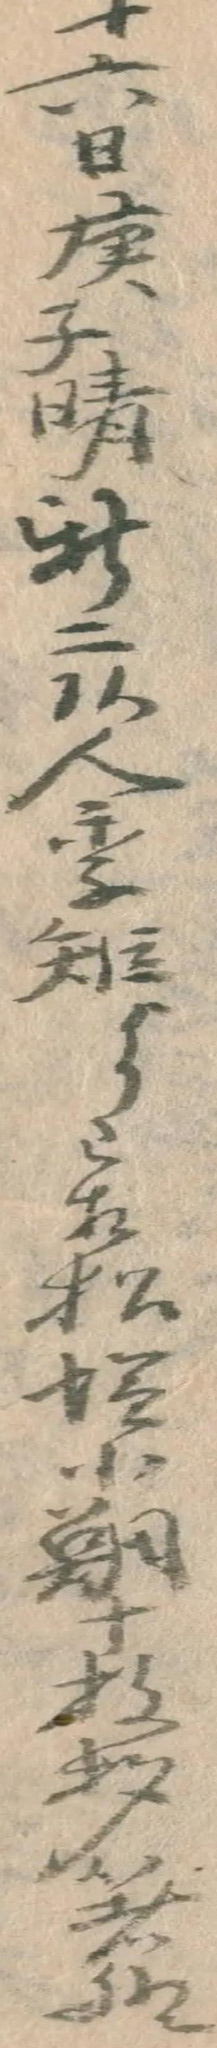十六日庚子晴新二頭人季矩より被相招桜小鯛十枚拶数候〆
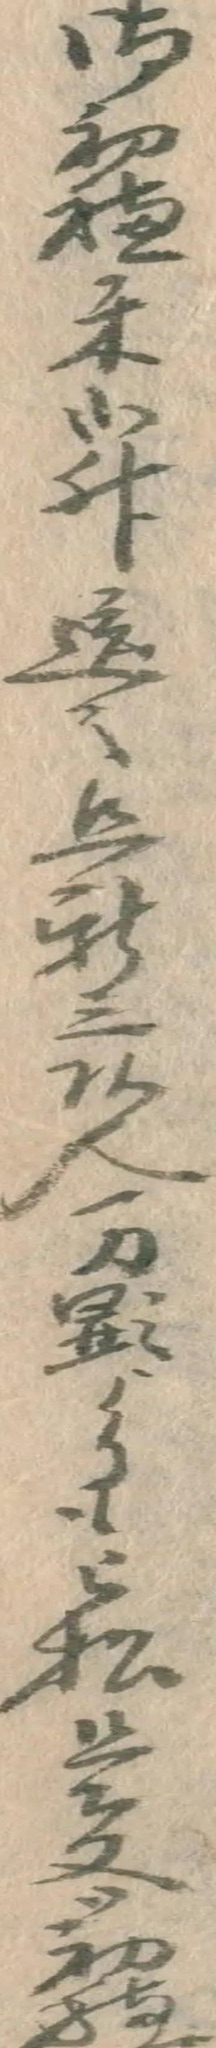御初穂米弐升送之且新三頭人万顕よりも被招是又御初穂
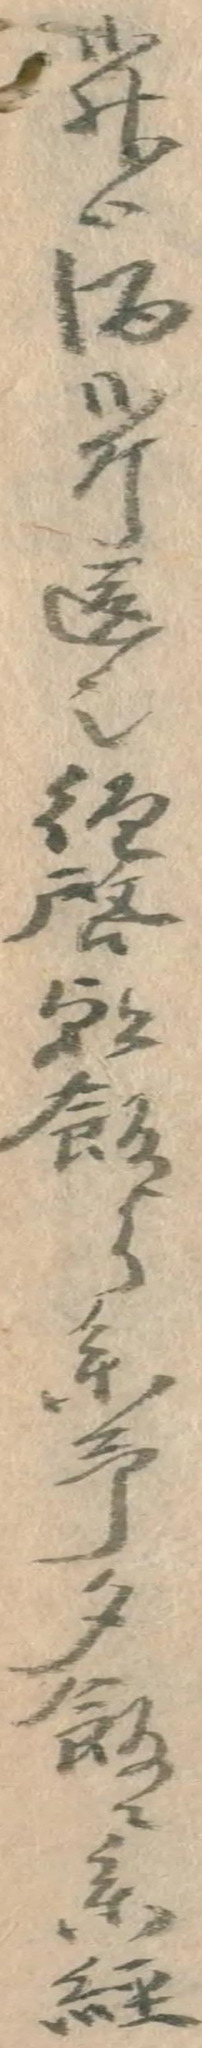弐升御酒弐升送之経啓朝飯より参予夕飯ニ参経

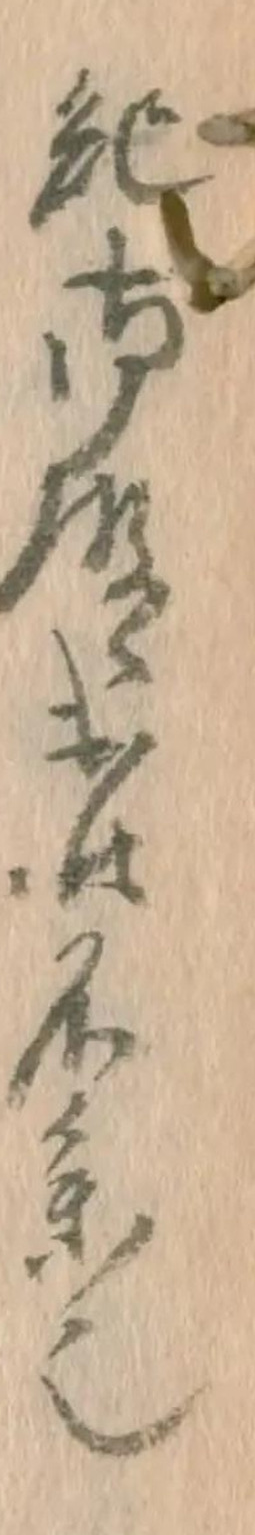紀御殿へ出仕不参也
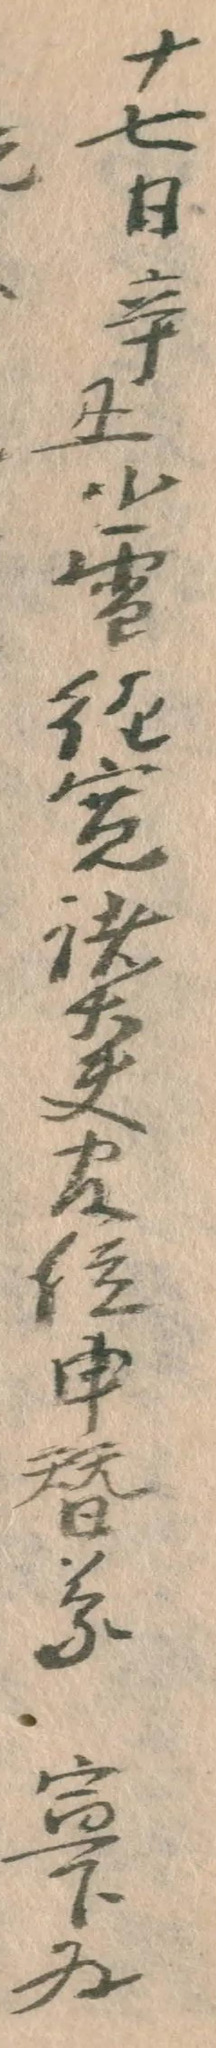十七日辛丑小雪経寛諸大夫官位申替蒙宣下為
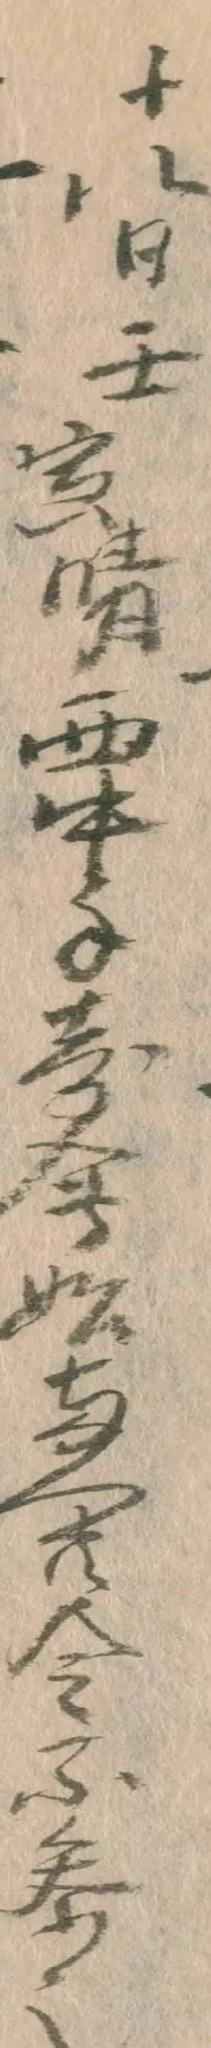十八日壬寅晴西中手寄會始両人共令不参也
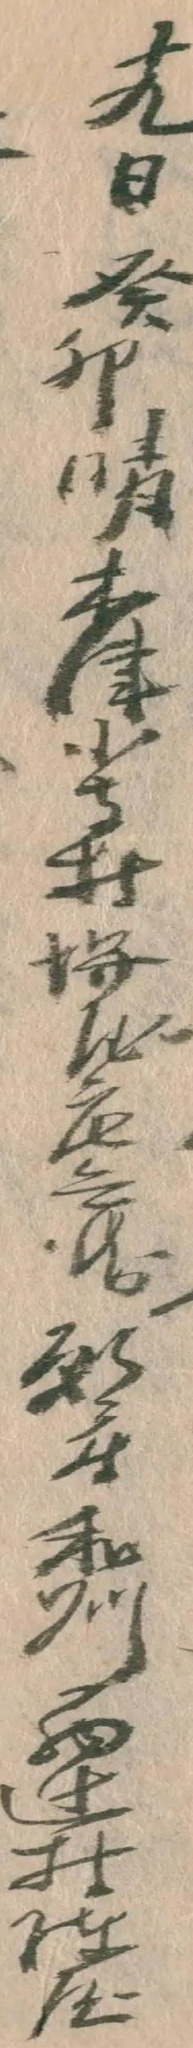十九日癸卯晴木津小寺村堺屋庄兵衛願ニ付和州西辻村陣屋
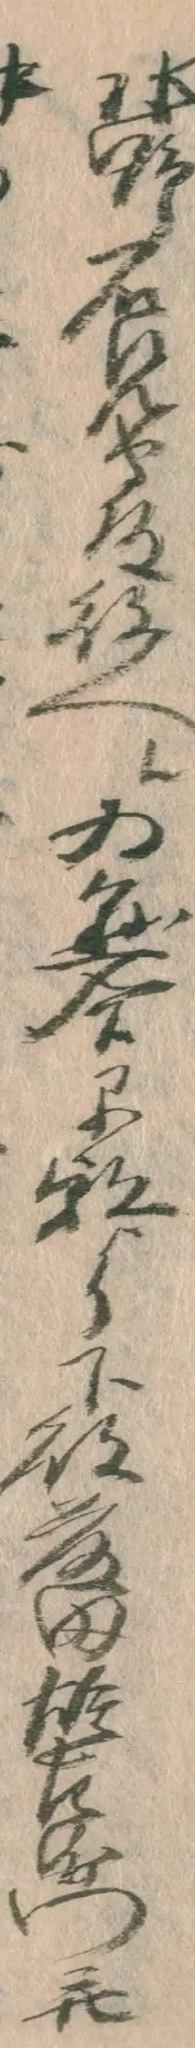水野石見守殿役人え為懸合早朝より下役藤田梶左衛門幷
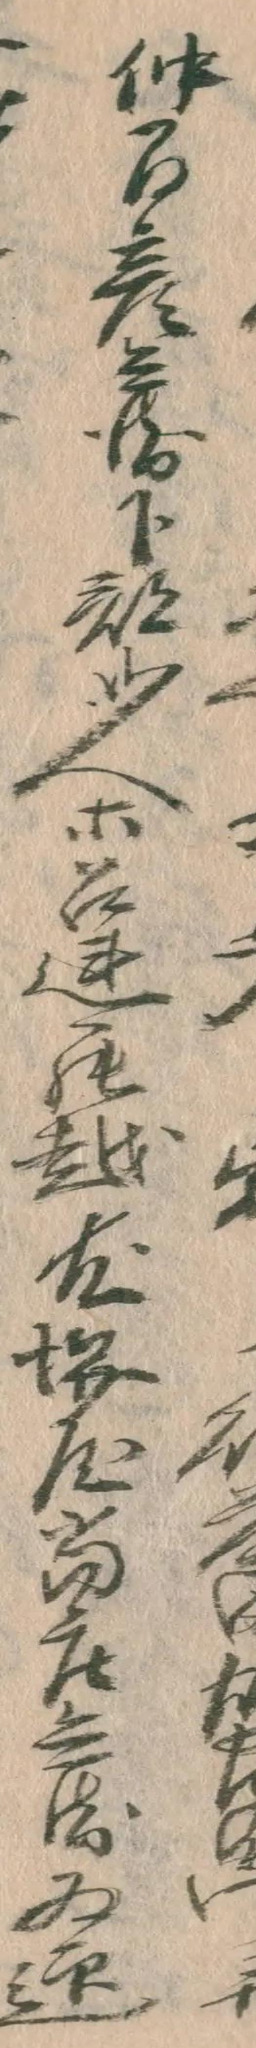仲間彦兵衛下部弐人等召連罷越尤堺屋當庄兵衛為迎
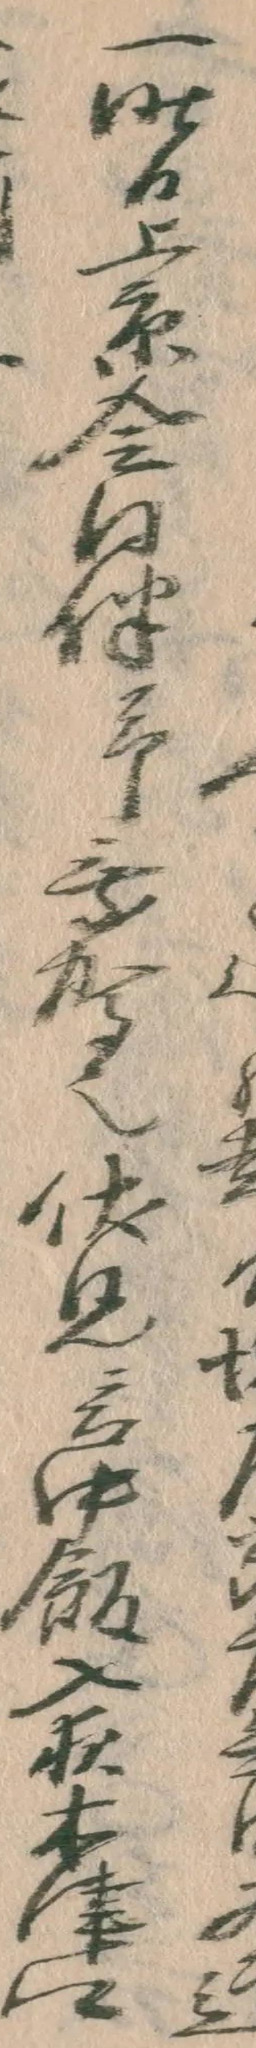一昨日上京会同伴予乗駕也伏見ニ而中飯入夜木津郷
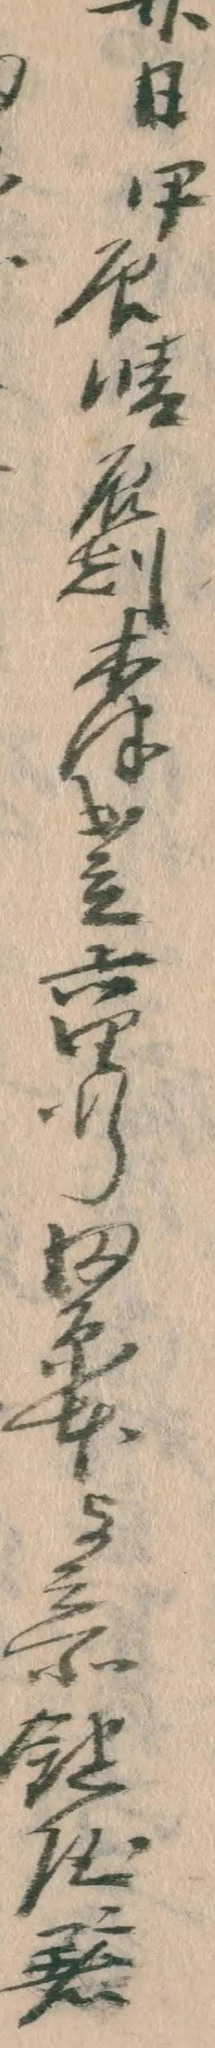廿日甲辰晴辰刻木津出立六里行田原本と云所領屋ニ着
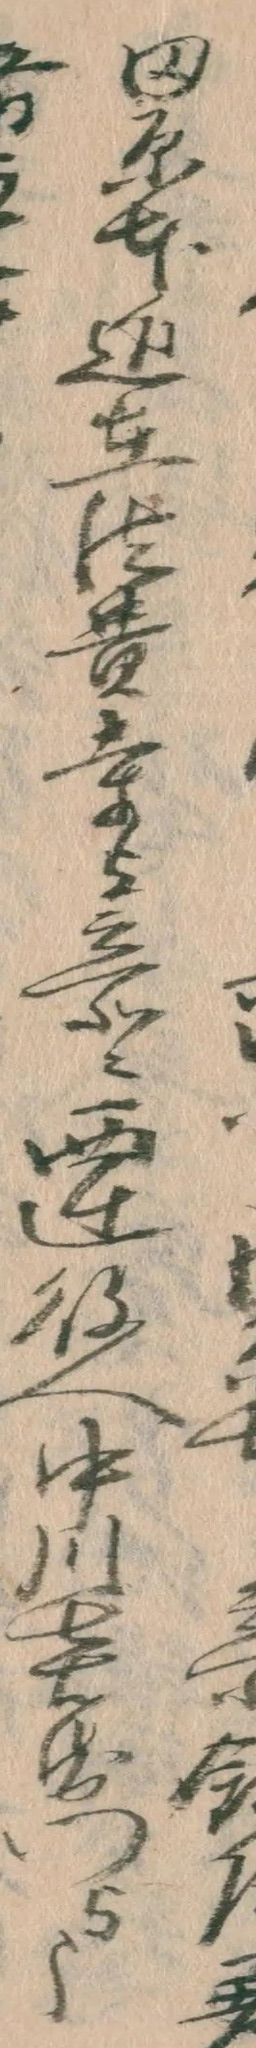田原本迎在法豊寺ゟ云所ニ西辻役人中川七右衛門と申
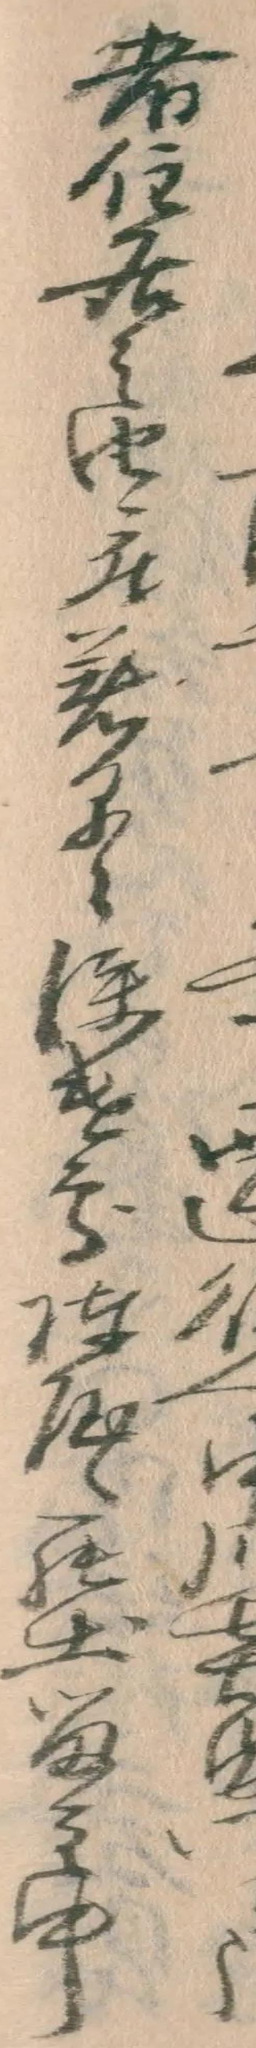者住居之由ニ付着早々遣処陣屋へ罷出留主中
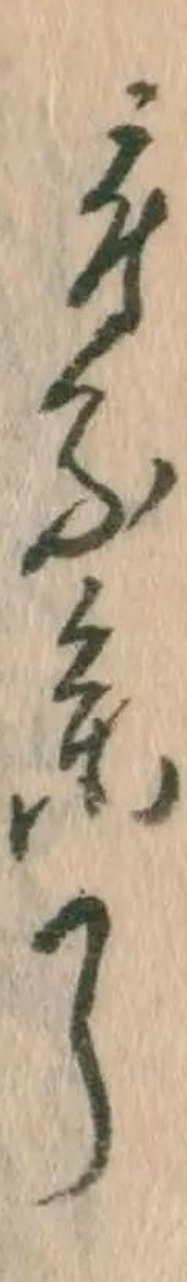ニ付不参了
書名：賀茂社記録. 第67冊
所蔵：国立国会図書館 National Diet Library, JAPAN
